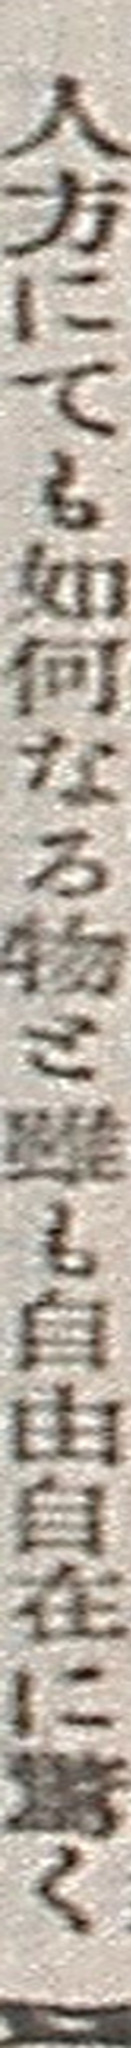人方にても如何なる物と雖も自由自在に驚く
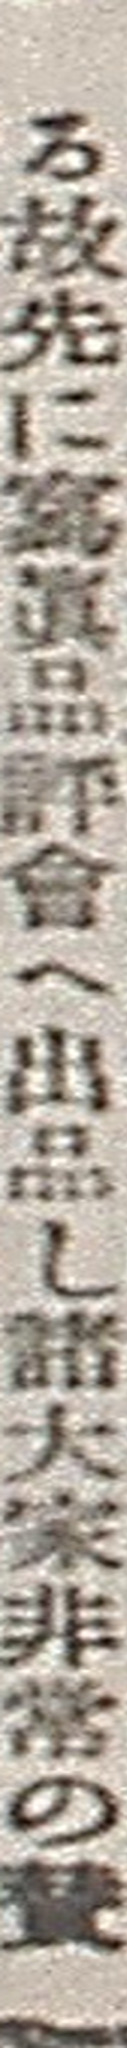る故先に写真品評会へ出品し諸大家非常に賛
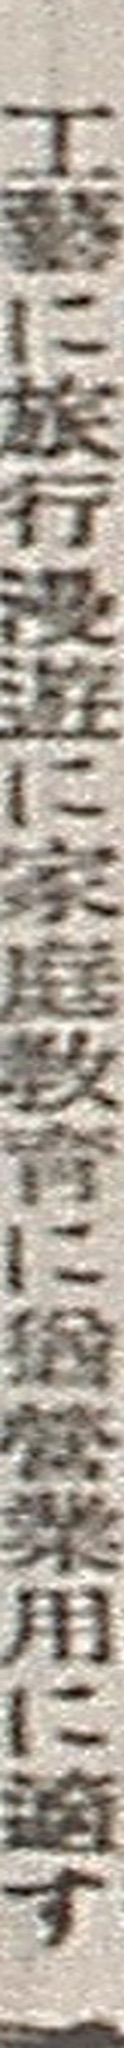工芸に旅行漫遊に家庭教育に猶営業用に適す
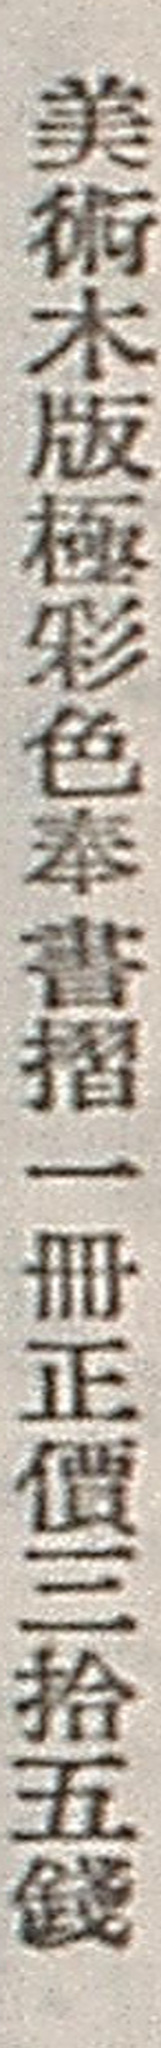美術木版極彩色奉書摺一冊正価三拾五銭
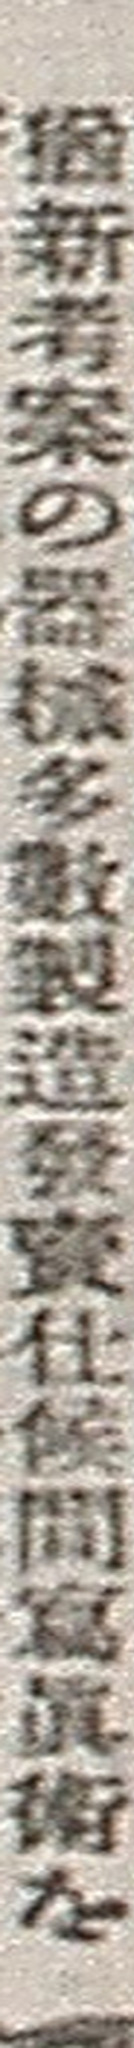猶新考案の器械多数製造発売仕候間写真述を
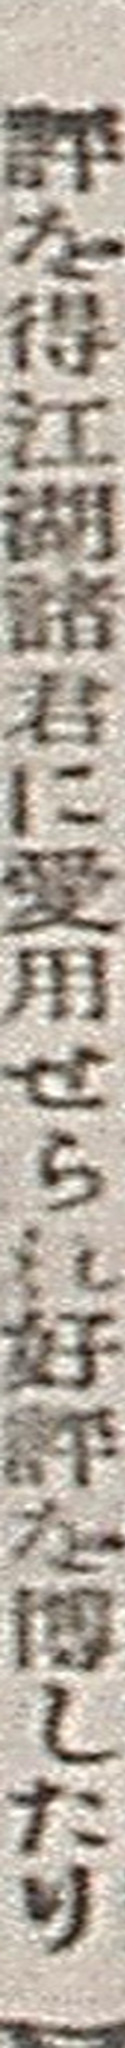評を得江湖諸君に愛用せられ好評を博したり
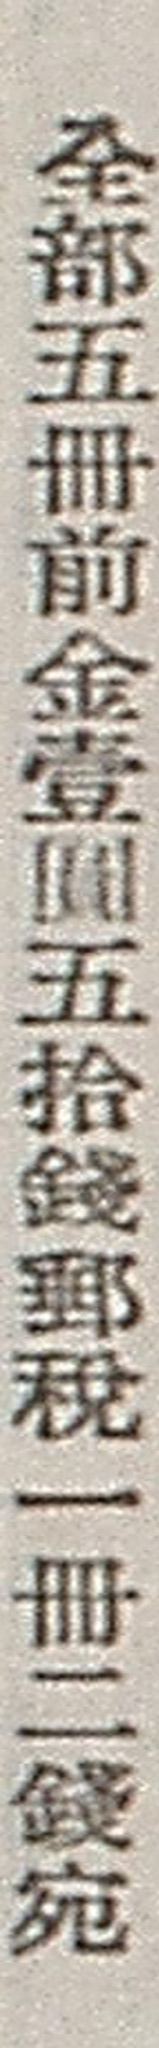全部五冊前金壱円五拾銭郵税一冊二銭宛
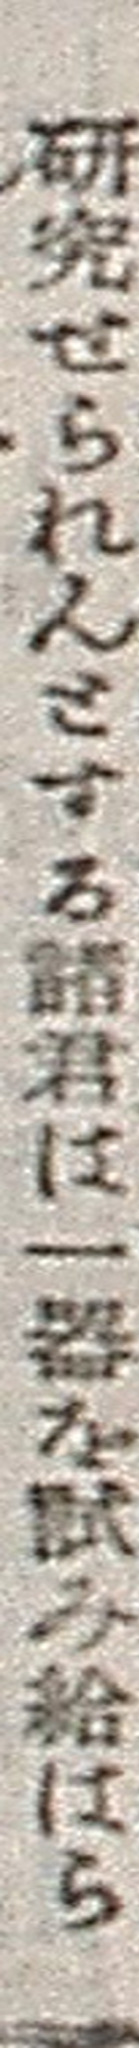研究せられんとする諸君は一器を試み給はら
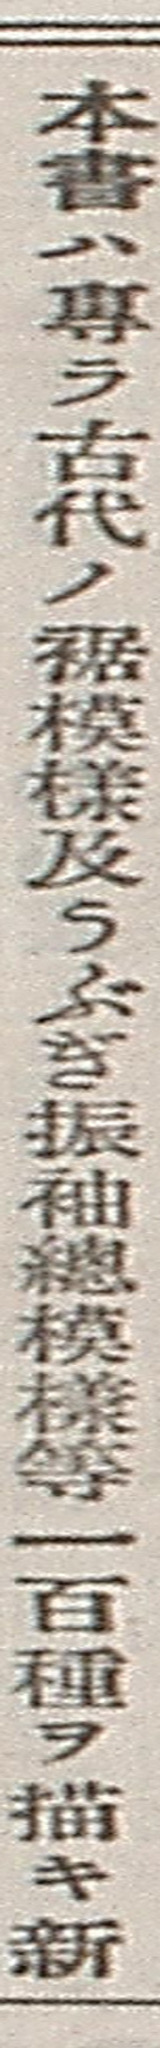本書ハ専ラ古代ノ裾模様及うぶぎ振袖総模様等一百種ヲ描キ新
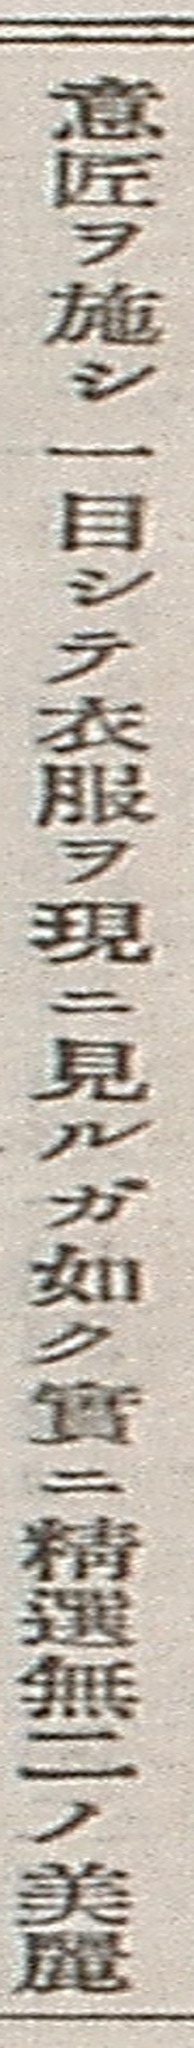意匠ヲ施シ一目シテ衣服ヲ現ニ見ルガ如ク実ニ精選無二ノ美麗
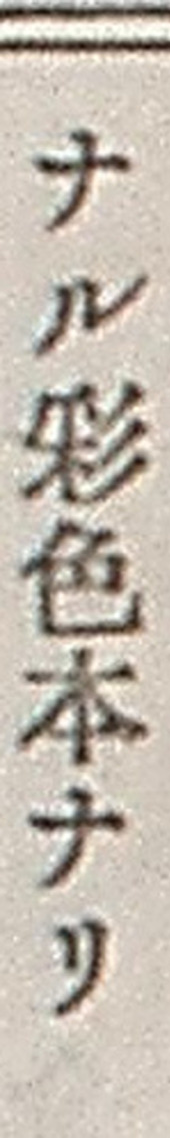ナル彩色本ナリ
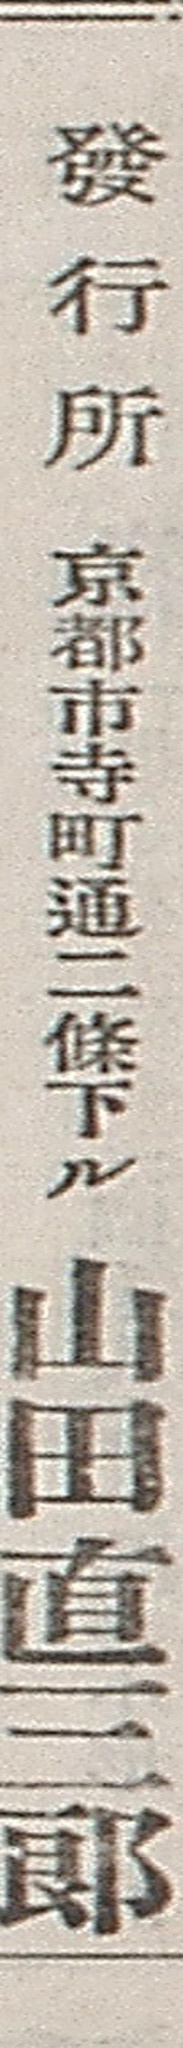発行所京都市寺町通二條下ル山田直三郎
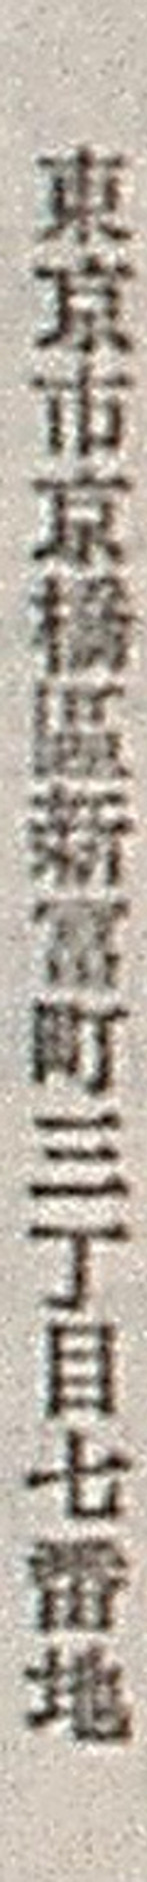東京京橋区新富町三丁目七番地

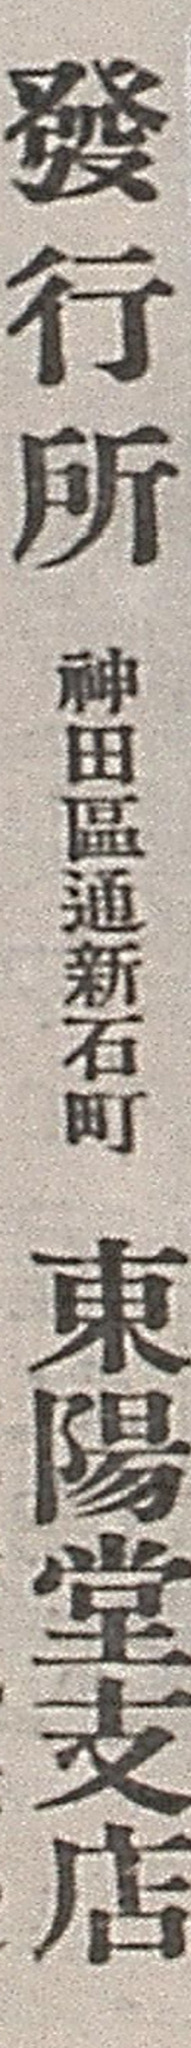発行礎神田区通新石町東陽堂支店

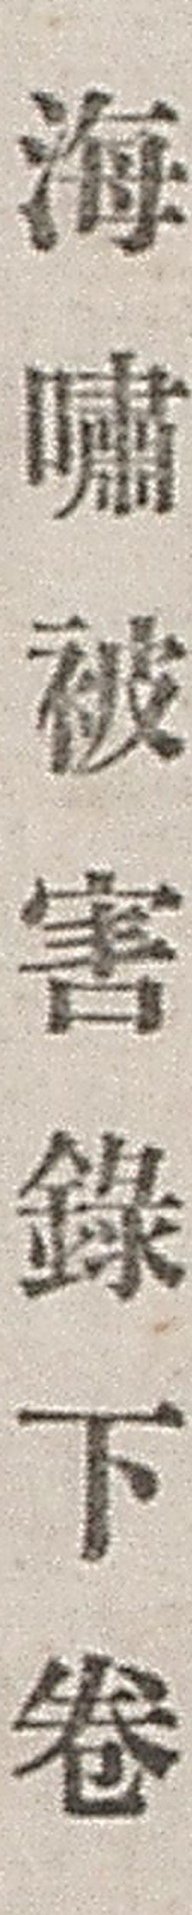海嘯被害録下巻
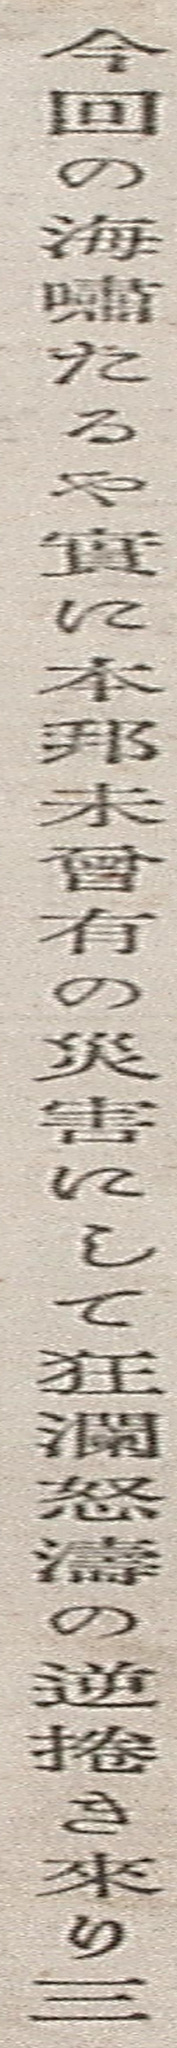今回の海嘯たるや実に本邦未曽有の災害にして狂瀾怒濤の逆捲き来り三
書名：風俗畫報臨時増刊第百十九號　大海嘯被害録（中）
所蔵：東京大学地震研究所図書室 Earthquake Research Institute Library, The University of Tokyo, JAPAN
